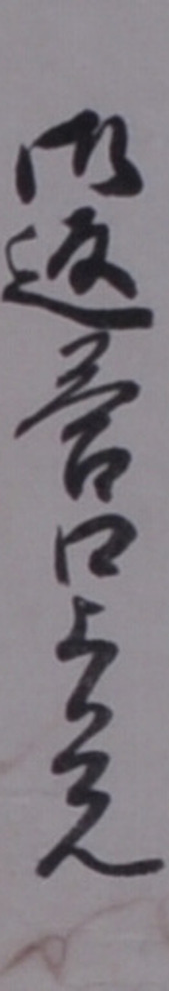御返答口上覚
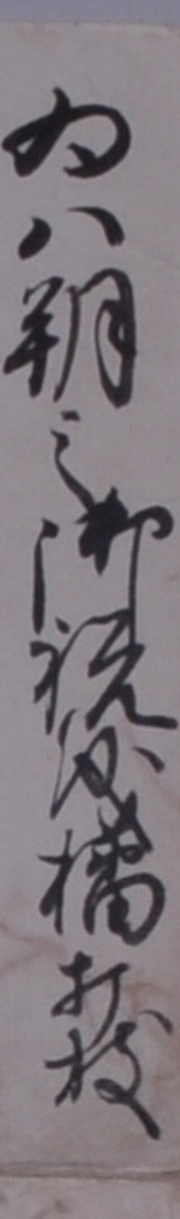為八朔之御祝儀橘折枝
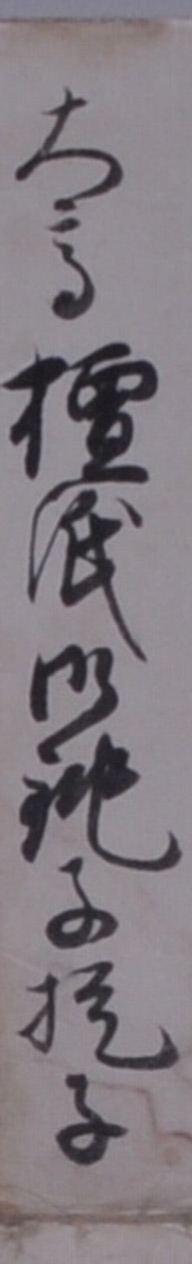大高檀紙御銚子提子
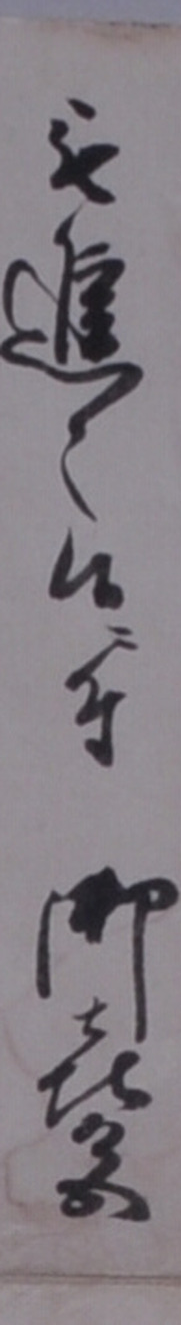被進之候ニ付御喜色
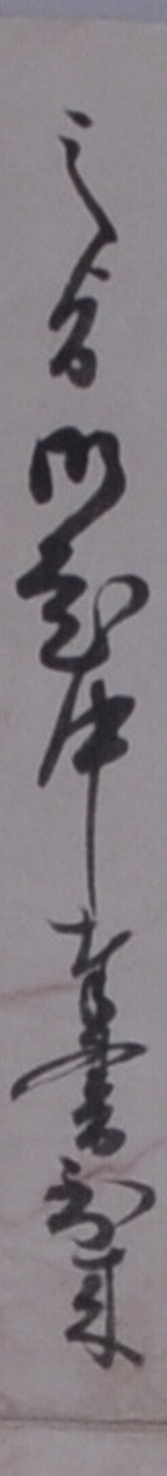之旨御老中奉書到来
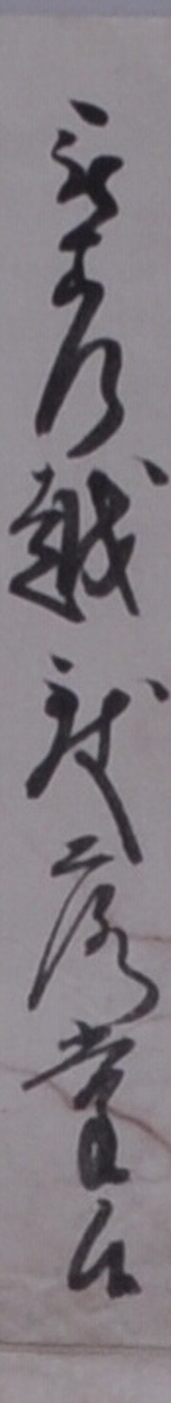被差越致落掌候
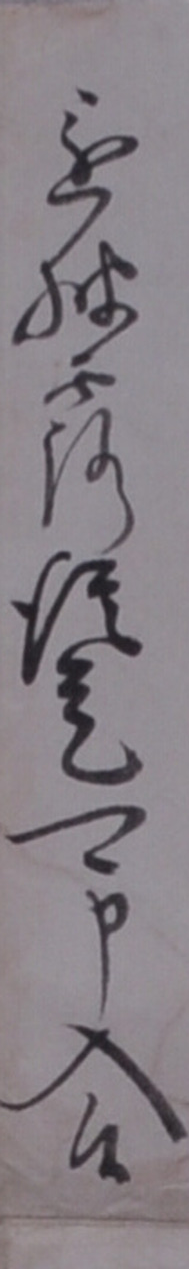遂披露従是可申入候
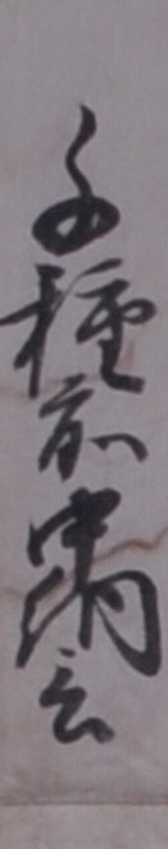千種前中納言
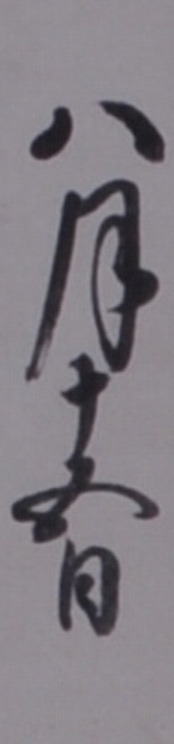八月十五日
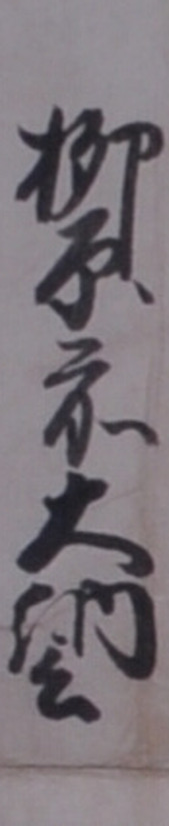柳原前大納言
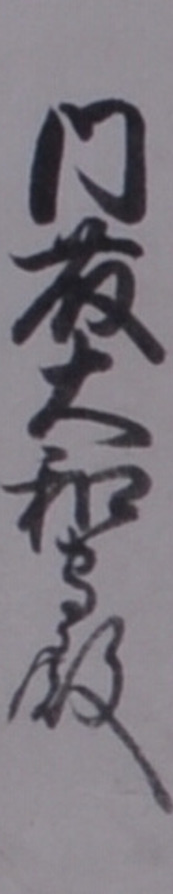内藤大和守殿
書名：御返答口上覚
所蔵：伊那市立高遠町図書館・合同会社AMANE
